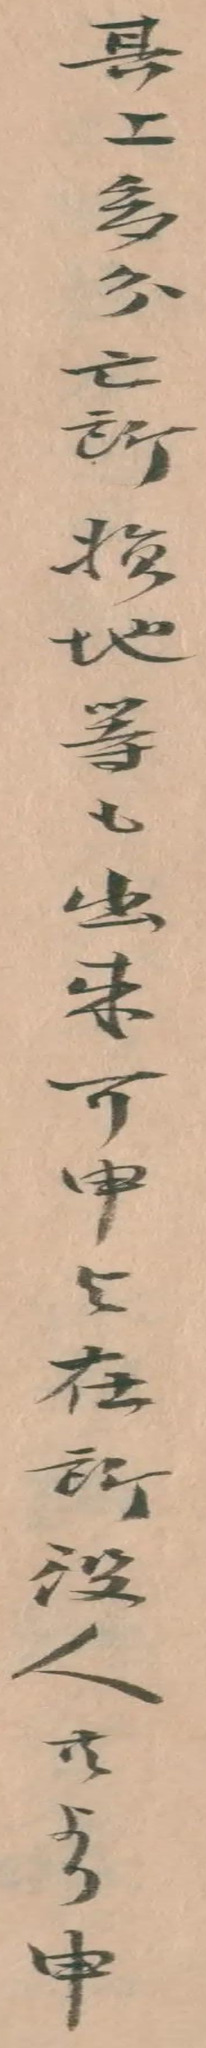其上多分亡所損地等も出来可申と在所役人共より申
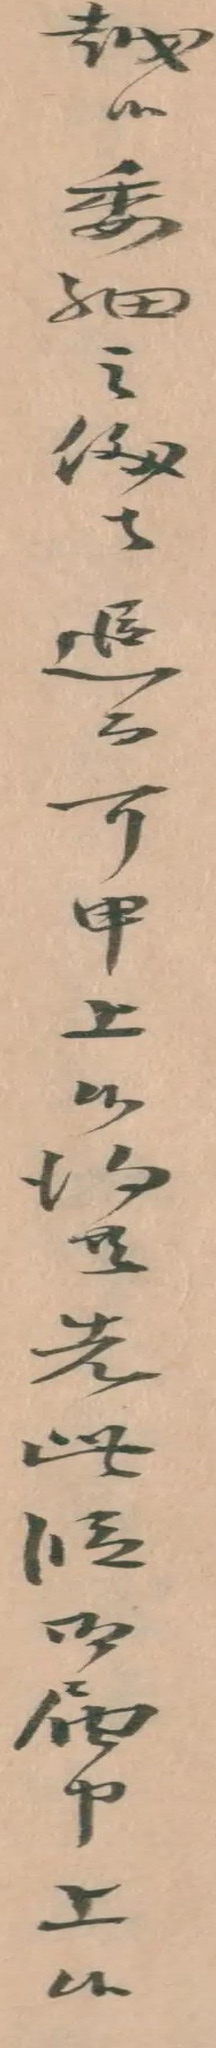越候委細之儀ハ追而可申上候得共先此段御届申上候

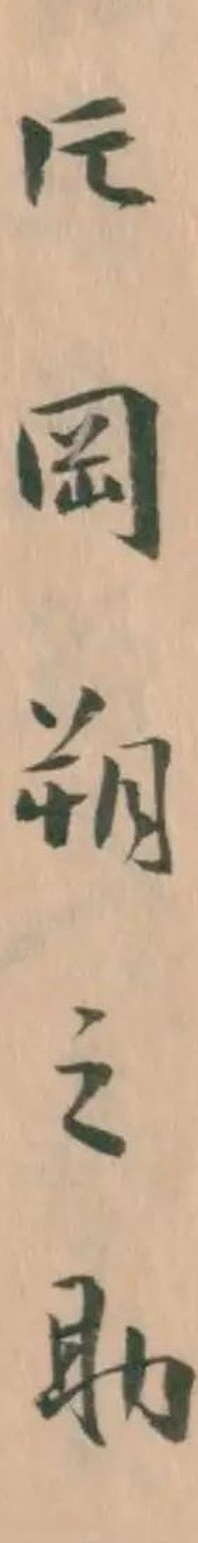片岡朔之助
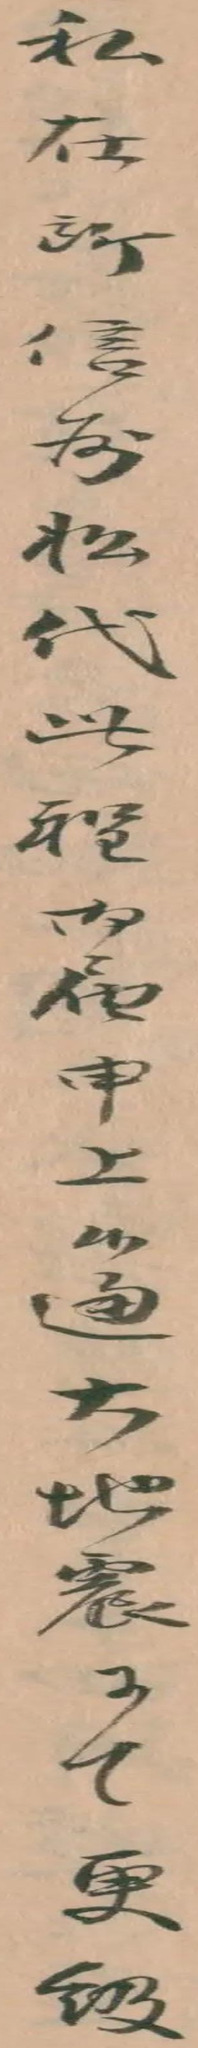私在所信州松代此程先御届申上候通大地震にて更級
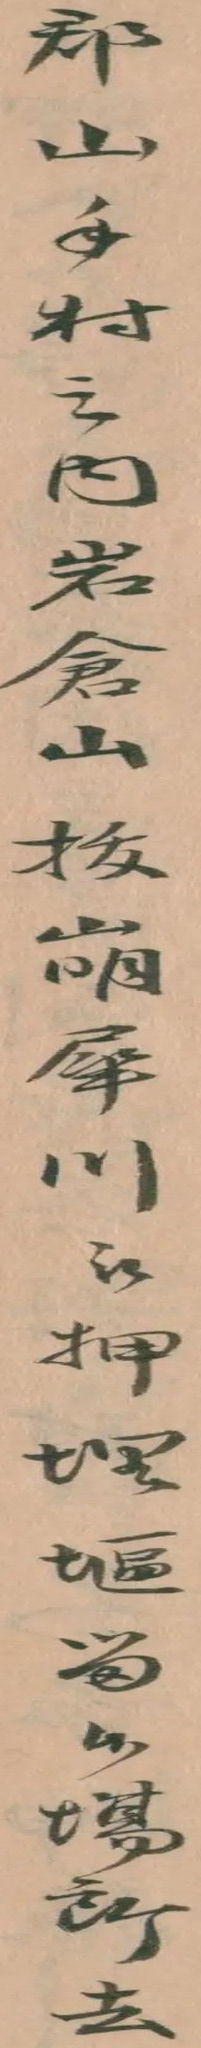郡山手村之内岩倉山抜崩犀川江押埋堰留候場所去
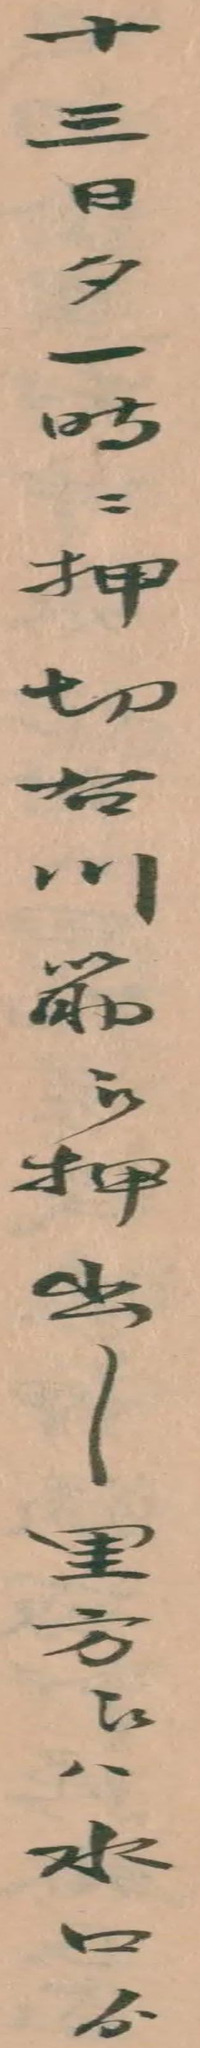十三日夕一時ニ押切右川筋江押出し里方江ハ水口ゟ
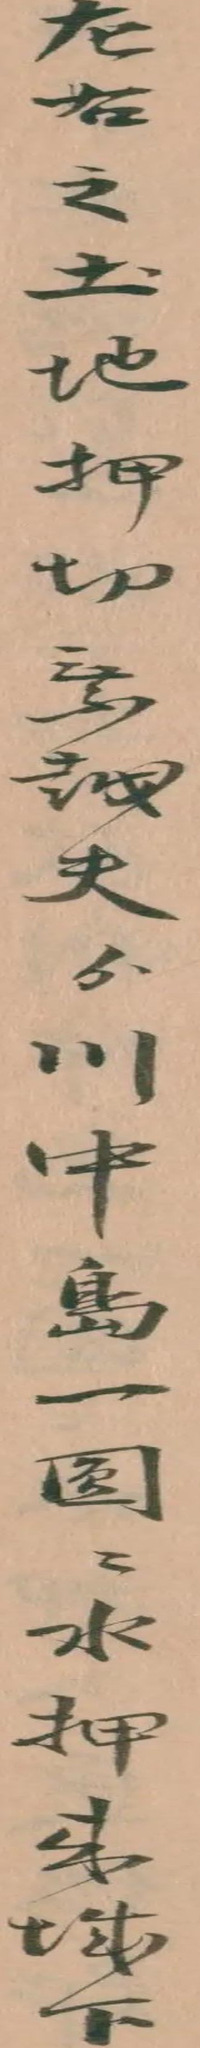左右之土堤押切乗越夫ゟ川中島一円二水押来城下
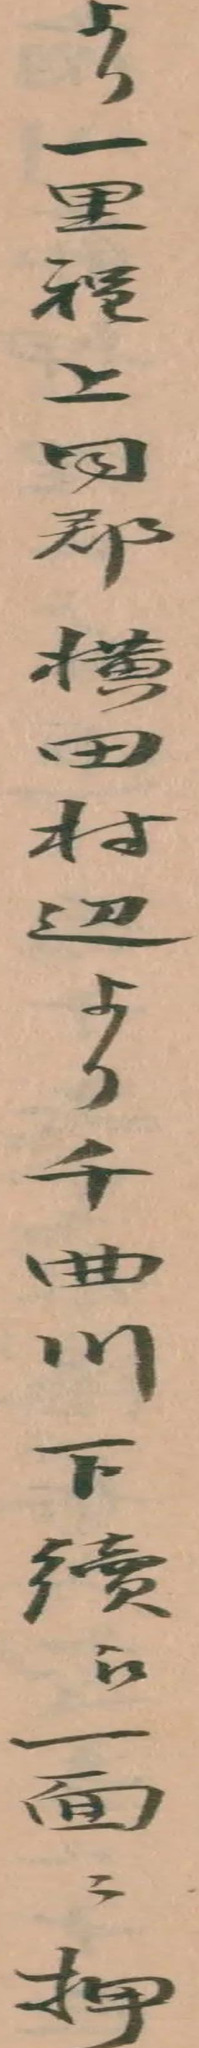より一里程上同郡横田村辺より千曲川下続江一面ニ押
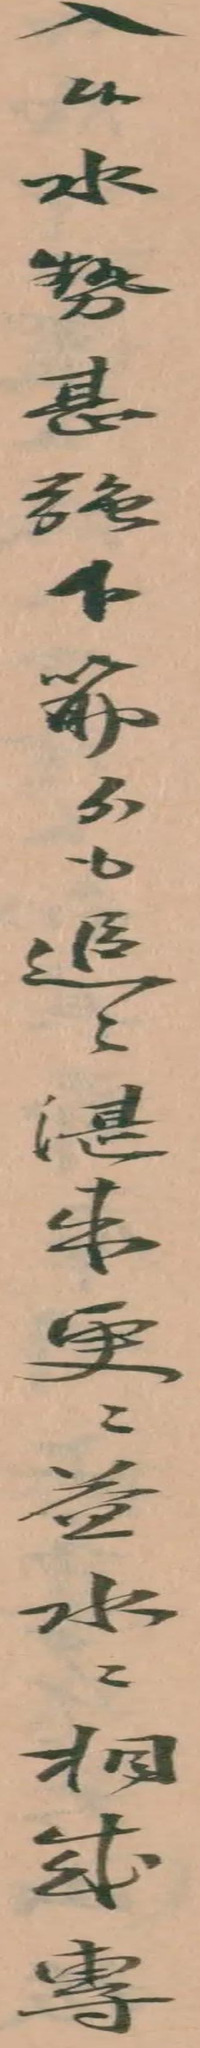入候水勢甚強下筋ゟも追々湛来更二益水ニ相成専
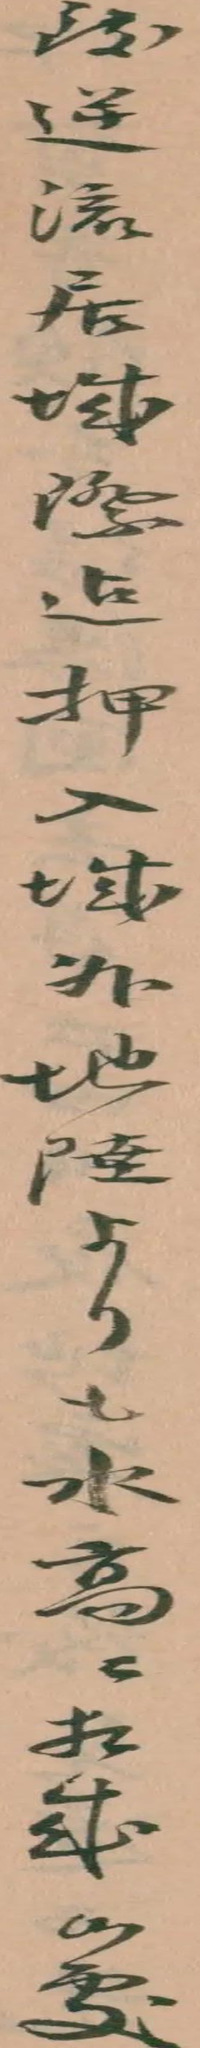致逆流居城際迄押入城外地陸よりも水高ニ相成候処
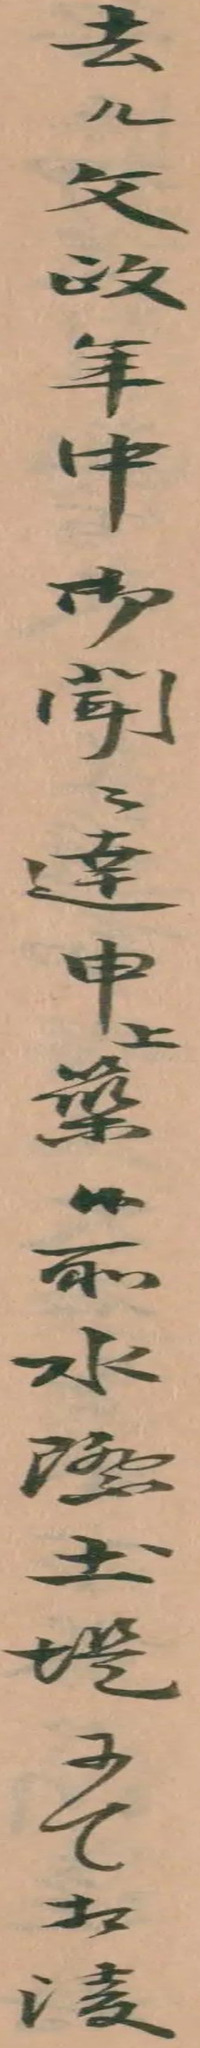去ル文政年中御聞二達申上築候所水除土堤にて相凌
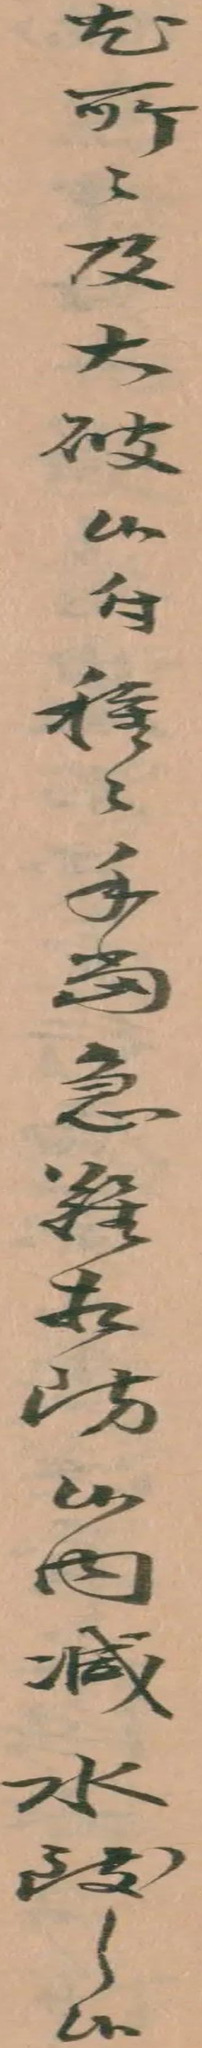尤所々及大破候付種々手当急難相防候内減水致し候
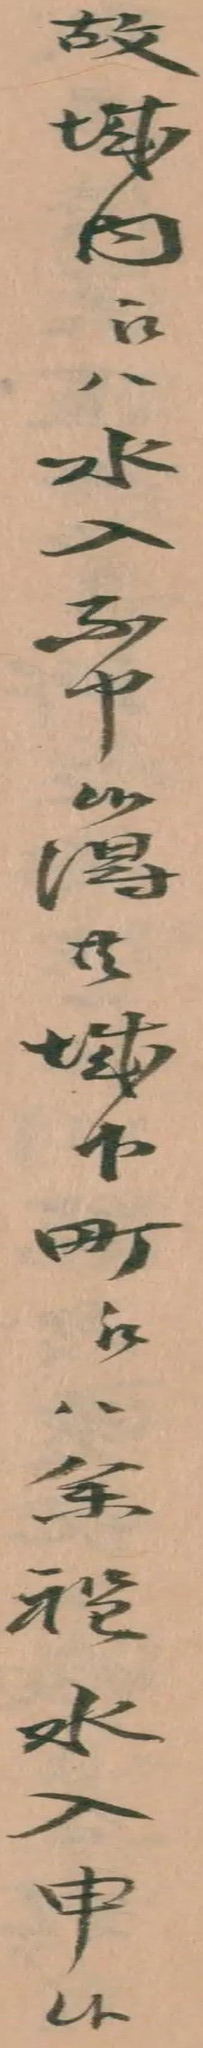故城内江ハ水入不申候得共城下町江ハ余程水入申候
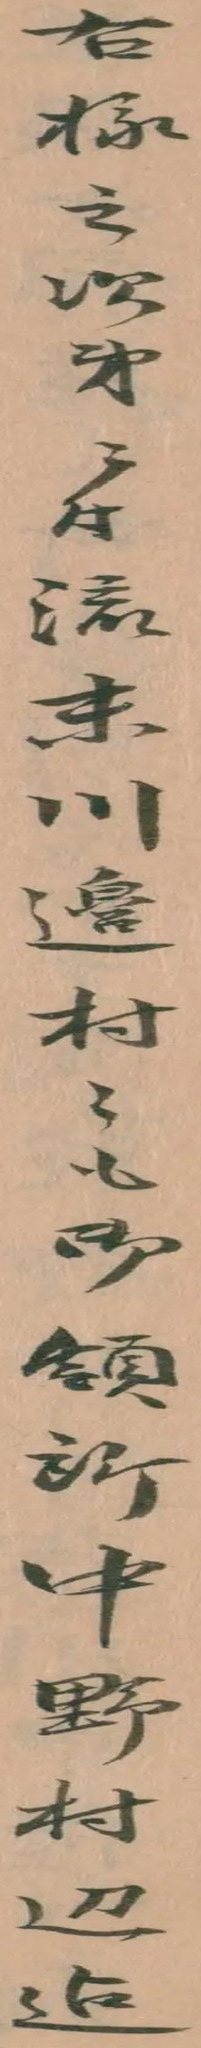右様之次第ニ付流末川辺村々も御領所中野村辺迄
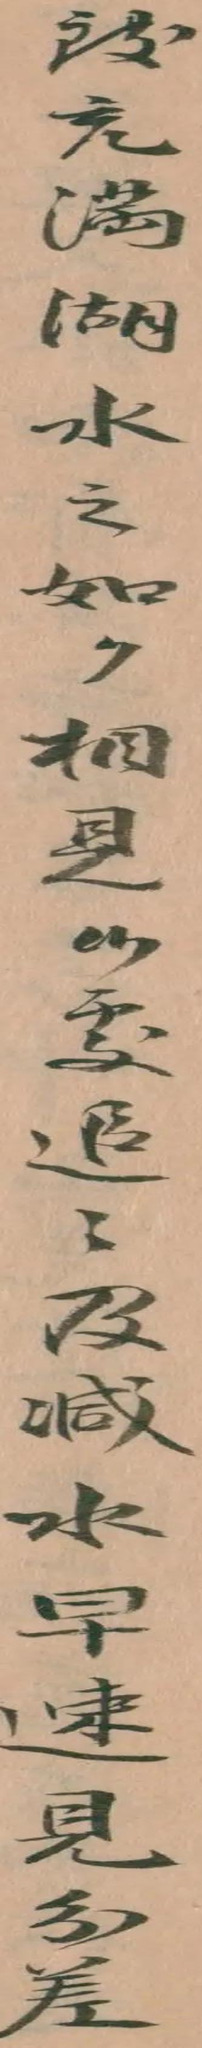致充満湖水之如ク相見候処追々及減水早速見分差
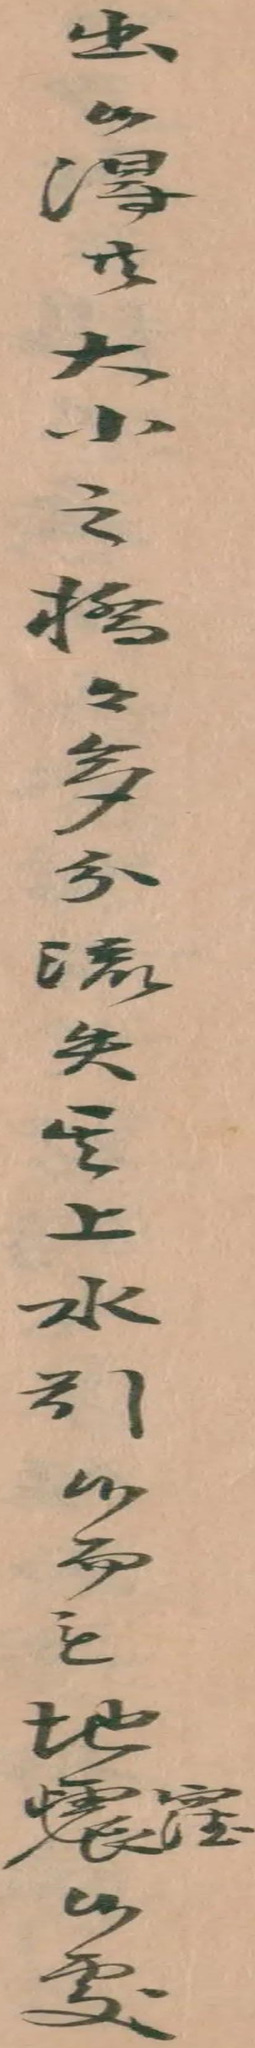出候得共大小之橋々多分流失其上水引候而も地窪候処
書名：地災撮要. 巻3(地震之部)-巻4(噴火之部)
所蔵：国立国会図書館 National Diet Library, JAPAN
